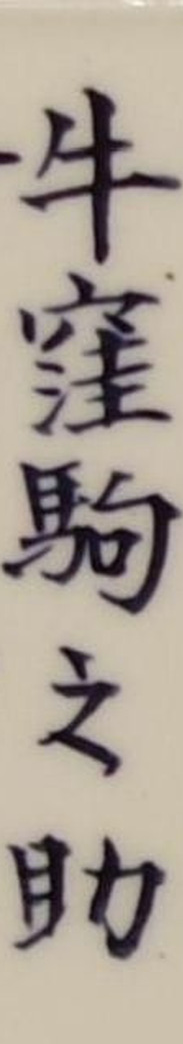牛窪駒之助
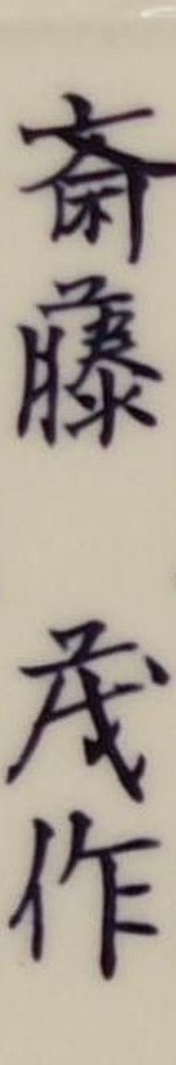斎藤茂作
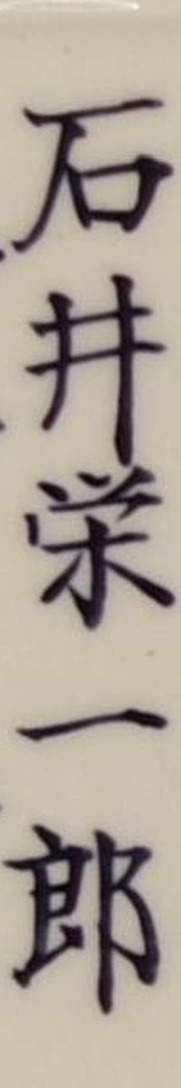石井栄一郎
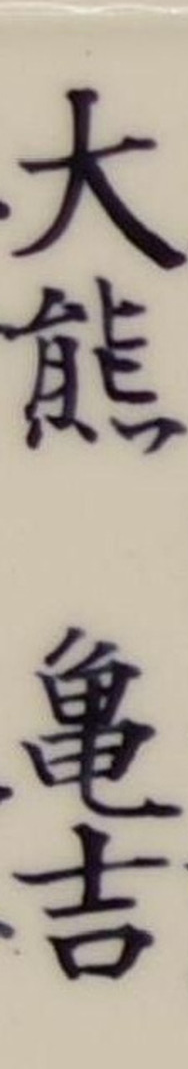大熊亀吉
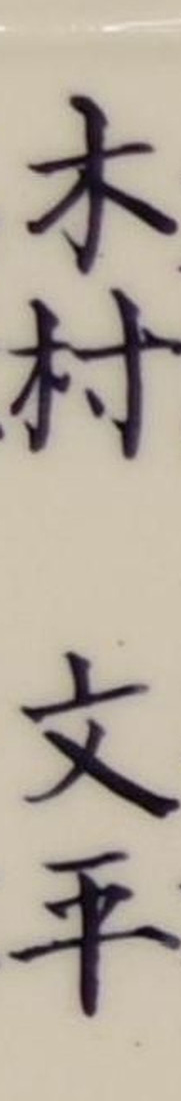木村文平
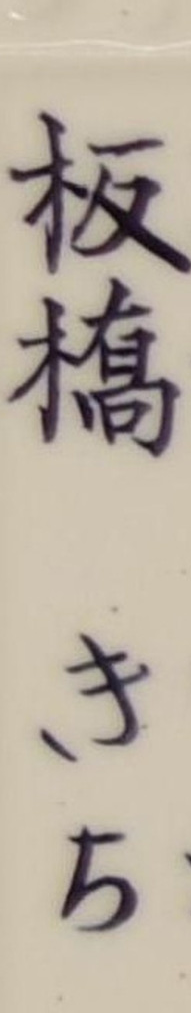板橋きち

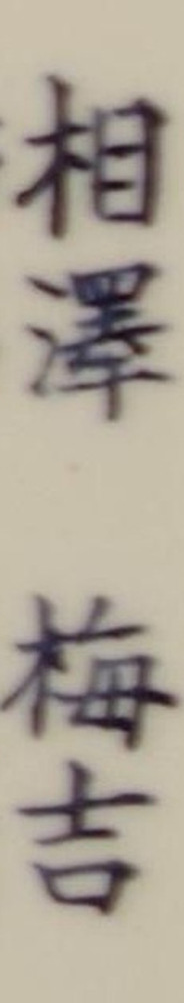相澤梅吉
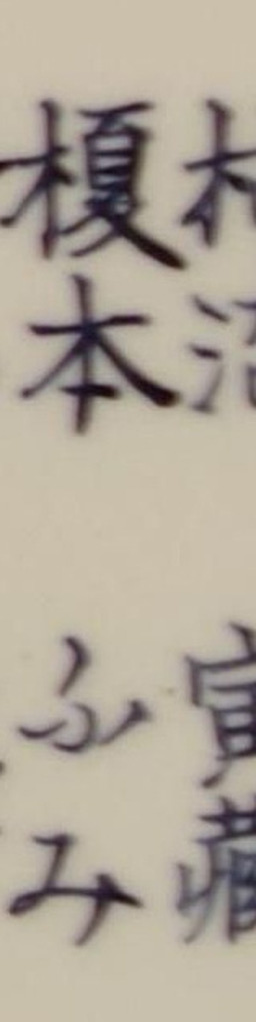榎本ふみ
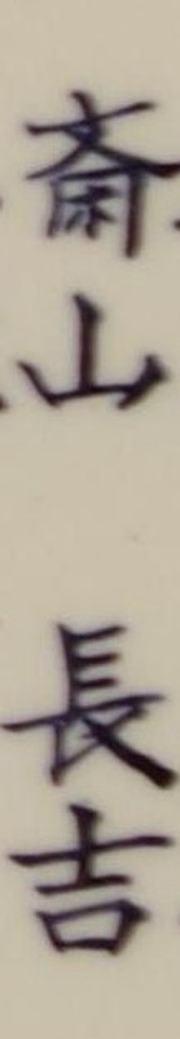斎山長吉
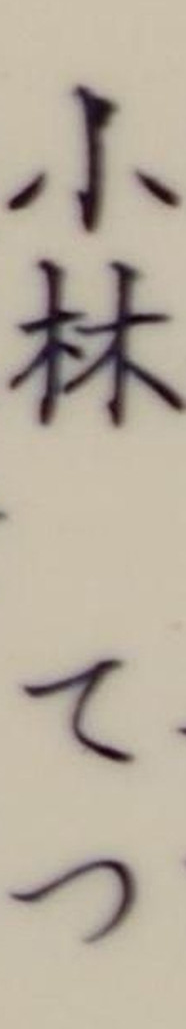小林てつ
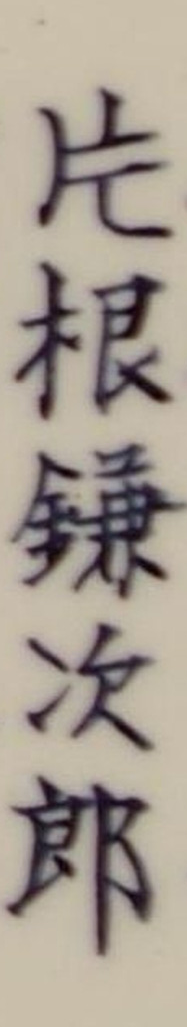片根鎌次郎
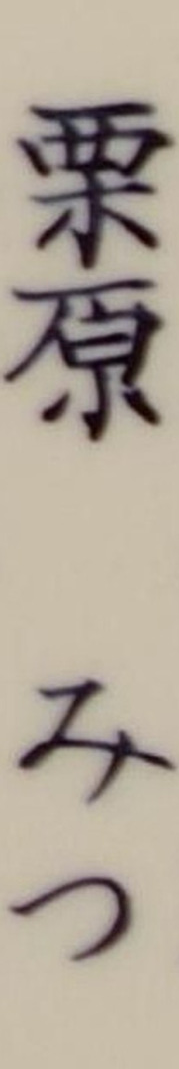栗原みつ
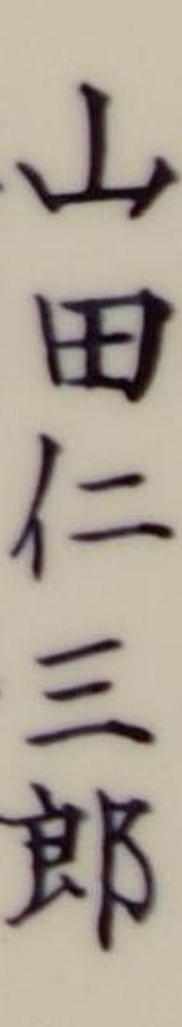山田仁三郎
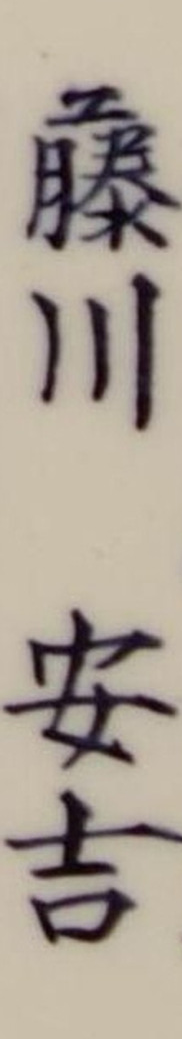藤川安吉
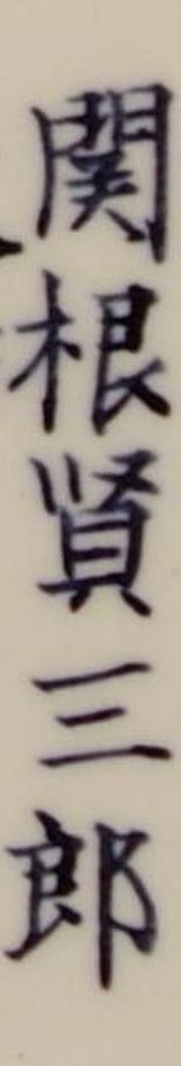関根賢三郎
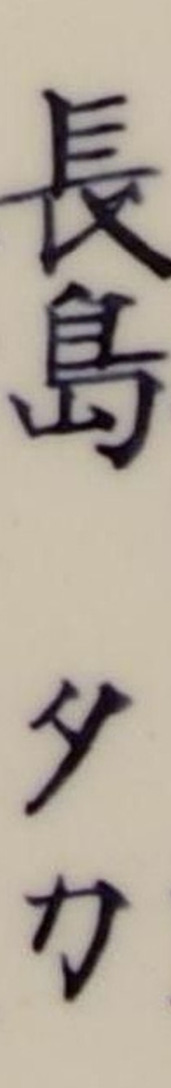長島夕カ
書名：M~S
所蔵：高野山金剛峯寺
